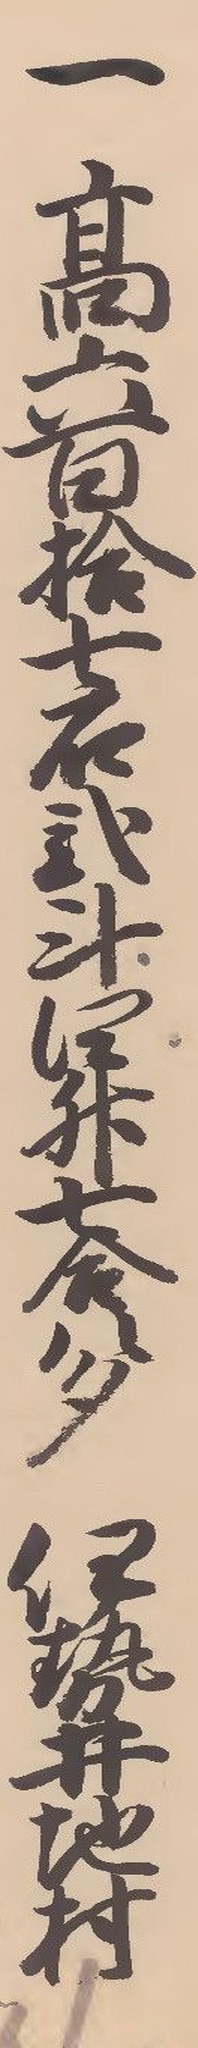一高六百拾七石弐斗四升七合勺八勺伊勢井地村
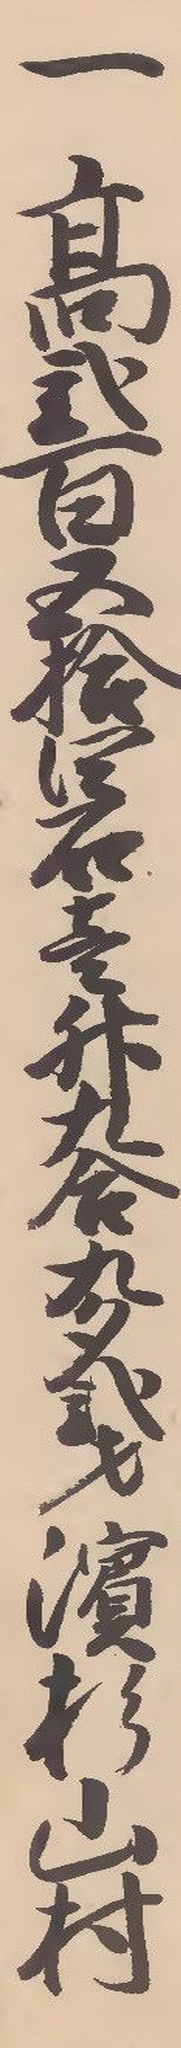一高弐百五拾四石壱升九合九勺弐才浜杉山村

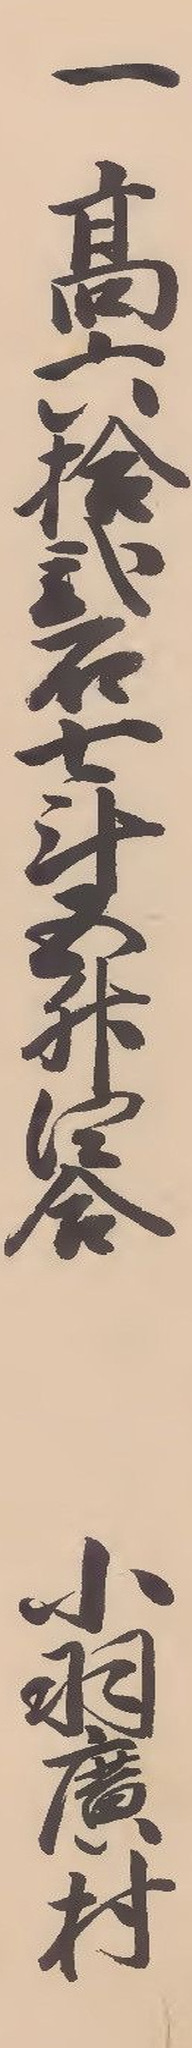一高六拾弐石七斗五升四合小羽広村
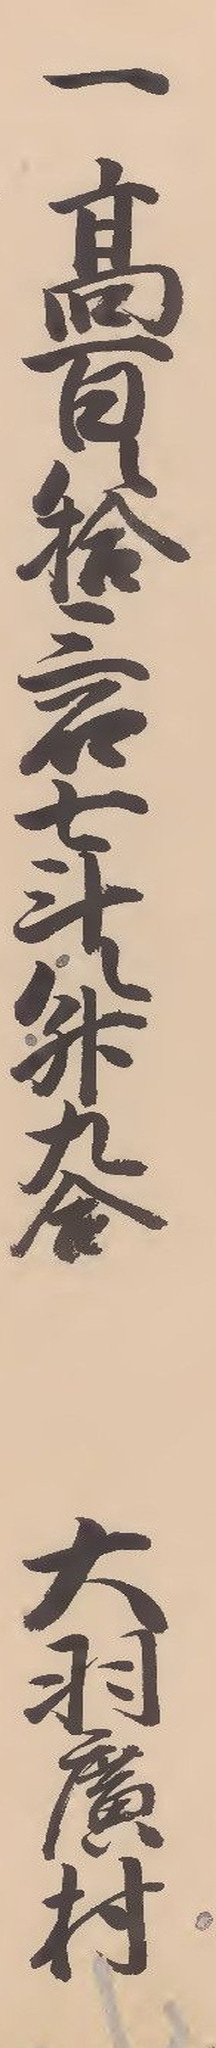一高百八拾三石七斗八升九合大羽広村
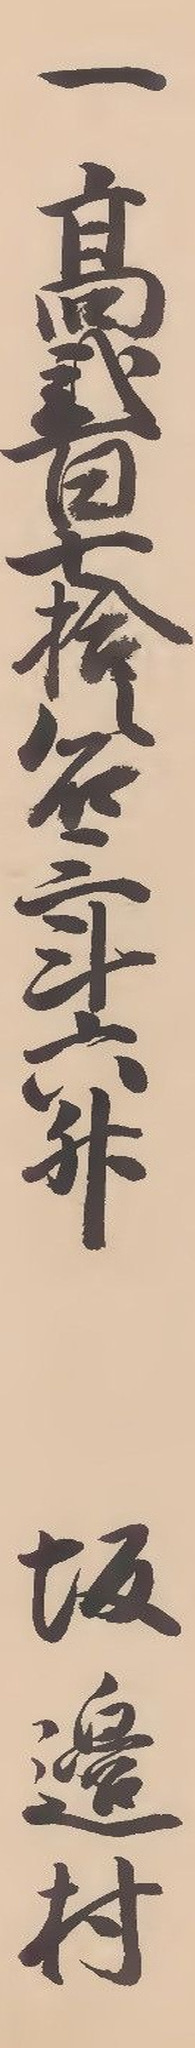一高弐百七拾八石三斗六升坂辺村
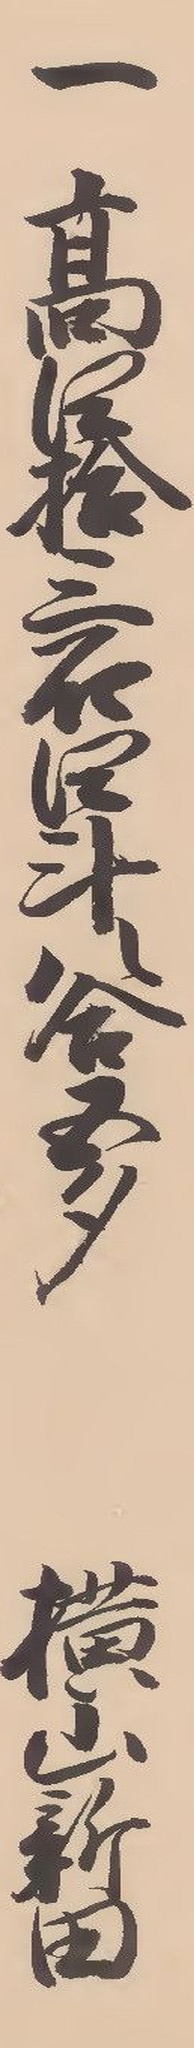一高四拾三石四斗八合五勺横山新田
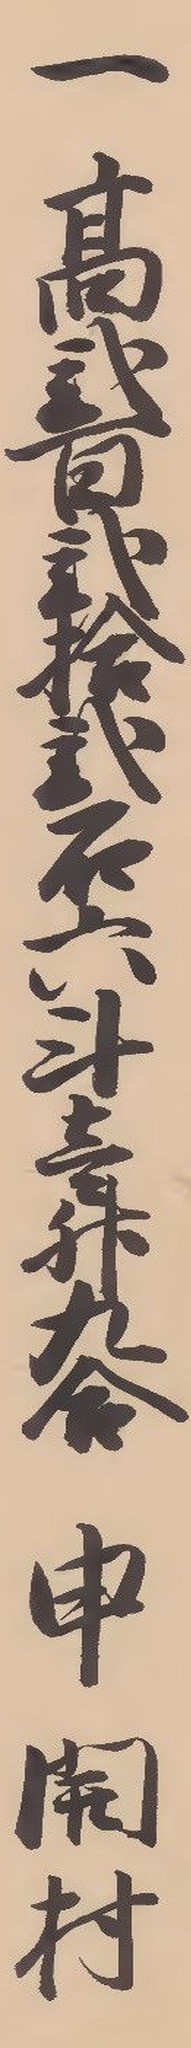一高弐百弐拾弐石六斗壱升九合申開村
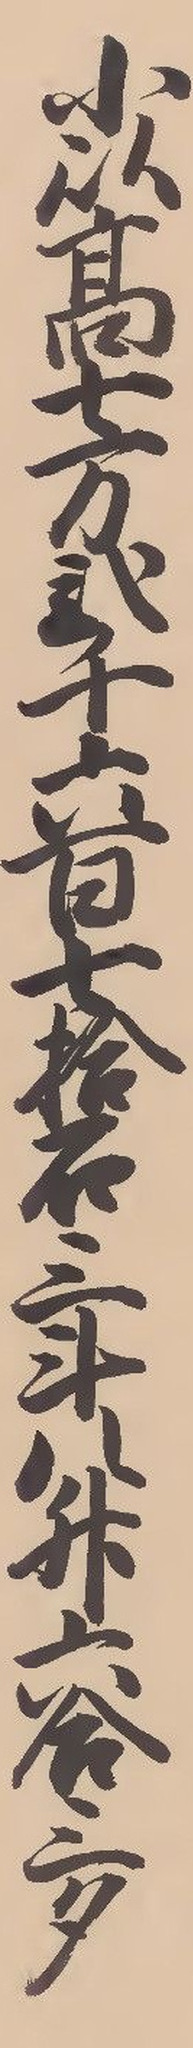小以高七万弐千六百七拾石三斗八升六合三勺
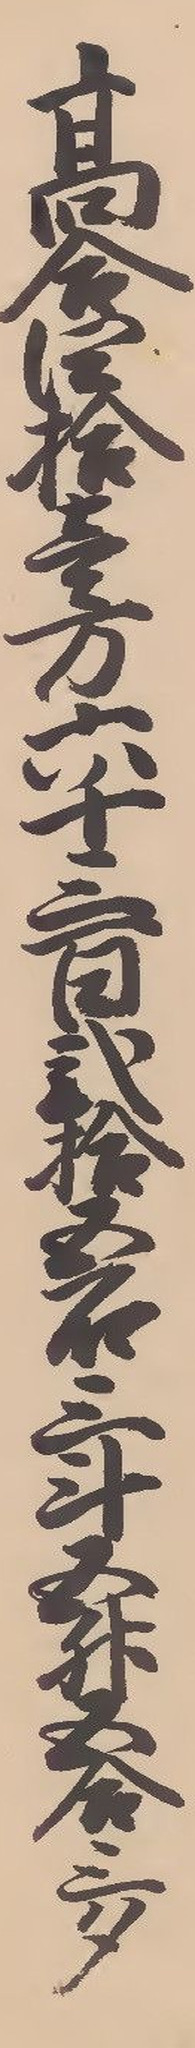高合四拾壱万六千三百弐拾五石三斗五升五合三勺

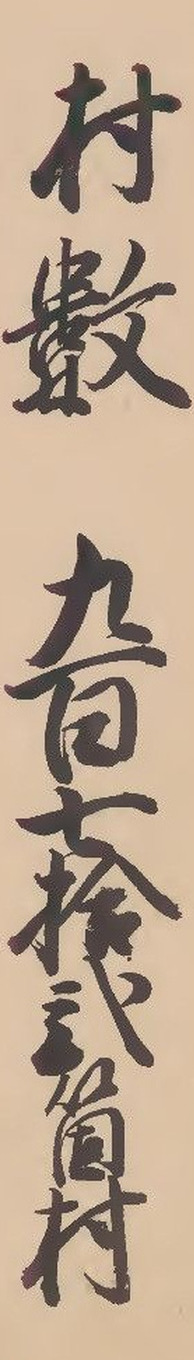村数九百七拾弐箇村
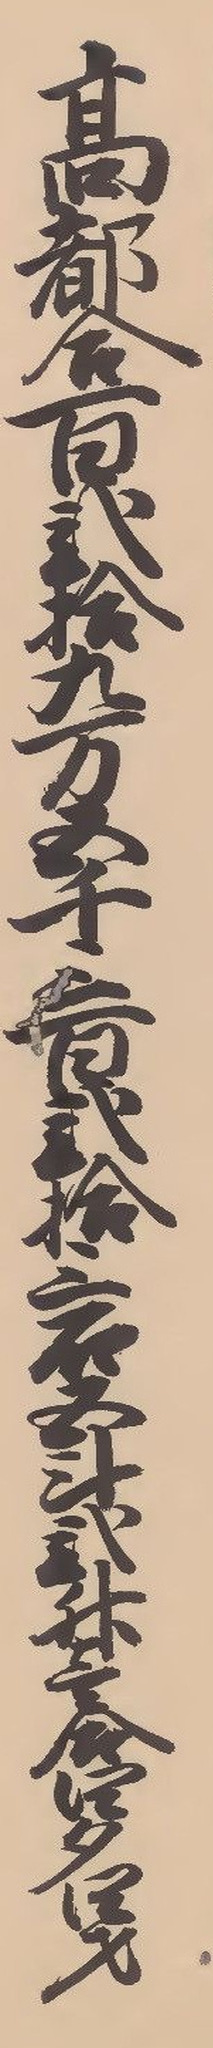高都合百弐拾九万五千三百弐拾三石五斗弐升壱合四勺四才
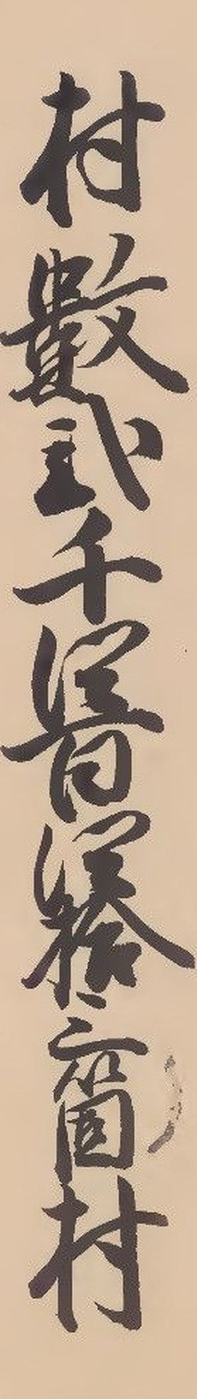村数弐千四百四拾三箇村
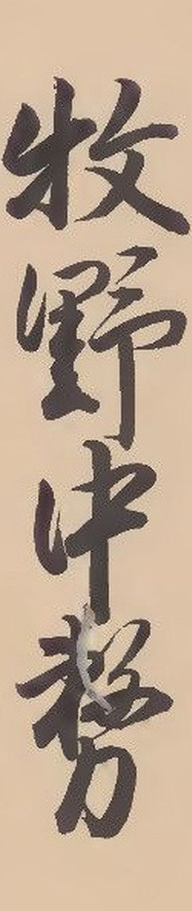枚野中務
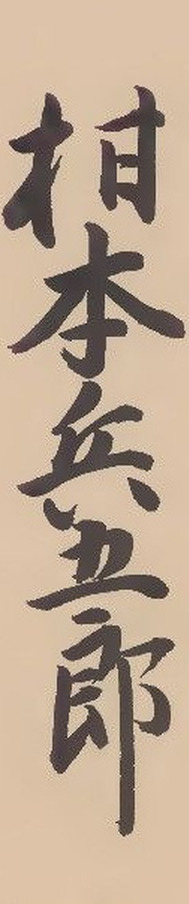柑本兵五郎
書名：出羽国郷帳　５
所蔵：国立公文書館 National Archives of Japan
